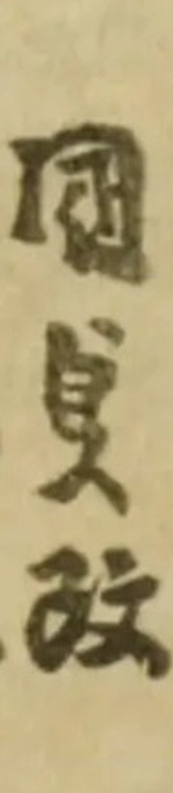国貞改
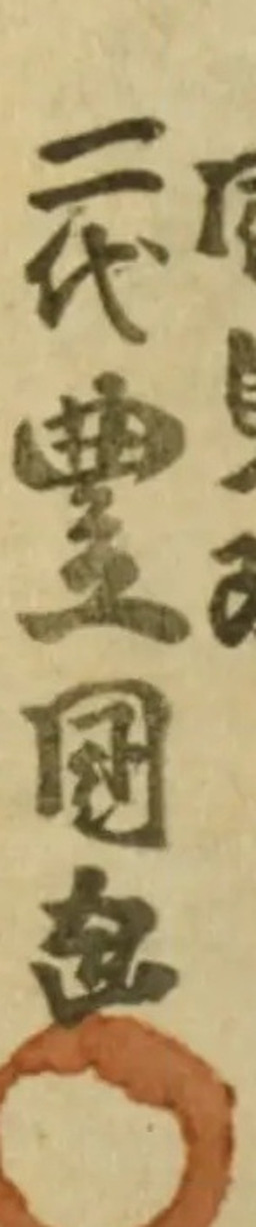二代豊国画
